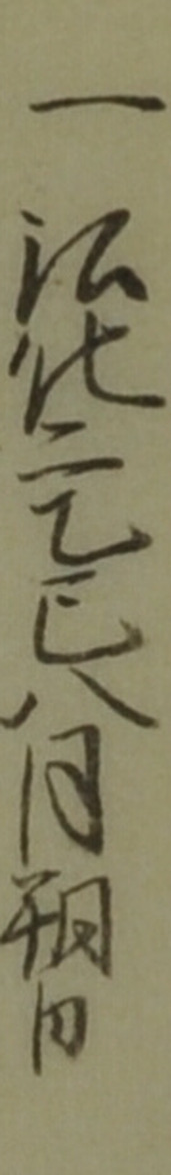一弘化乙巳八月朔日
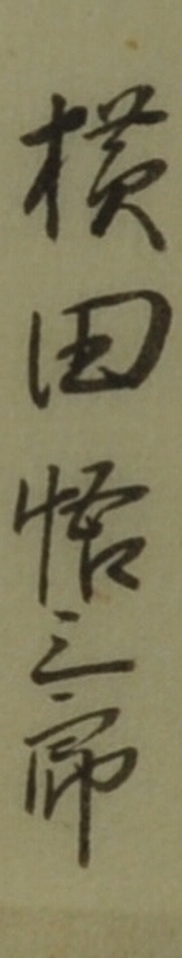横田悟三郎
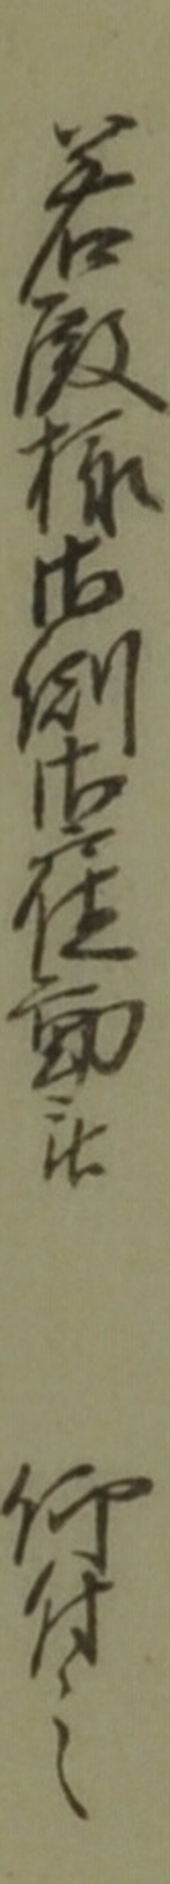若殿様御側御雇勤被仰付之
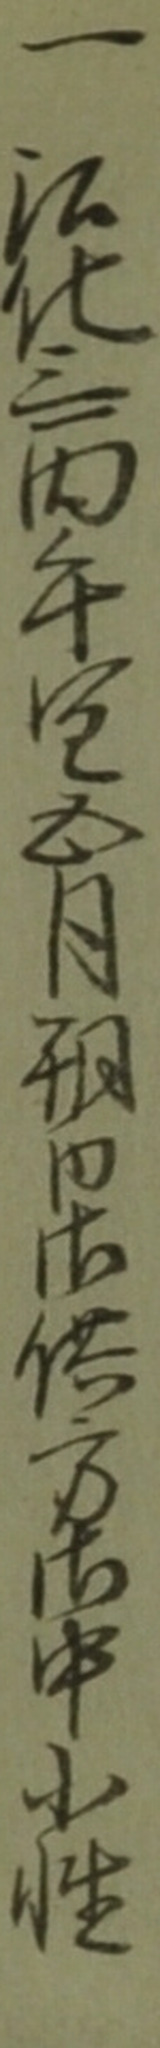一弘化三丙午閏五月朔日御供方御中小性
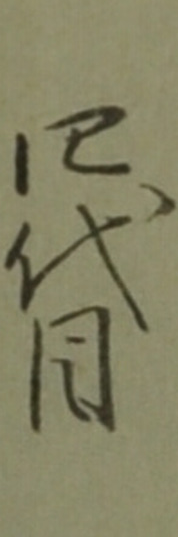四代目
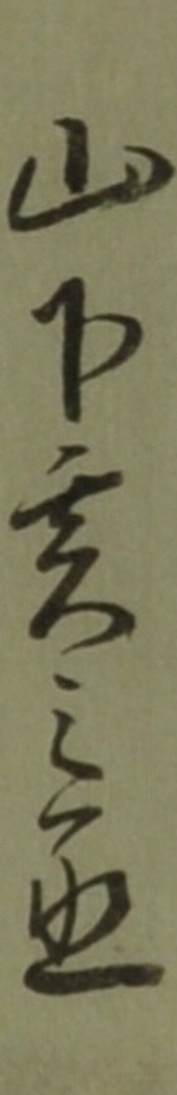山下亥之丞
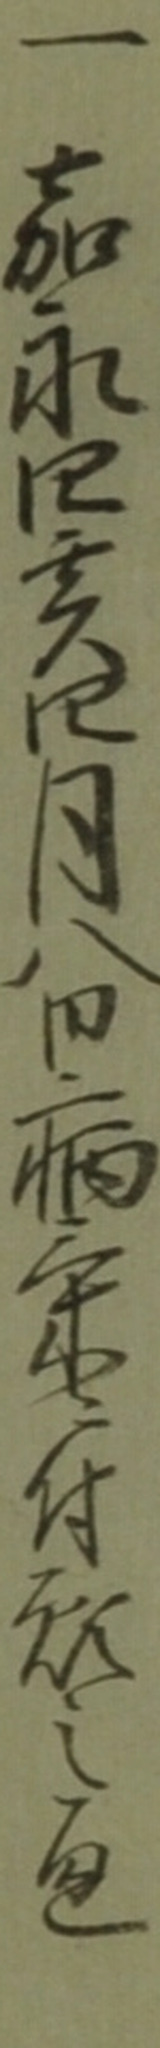一嘉永四亥四月八日病気ニ付願之通
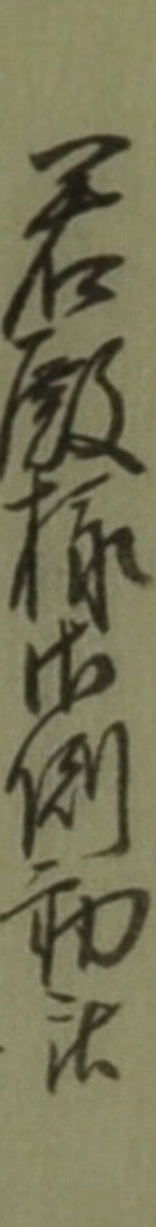若殿様御側勤
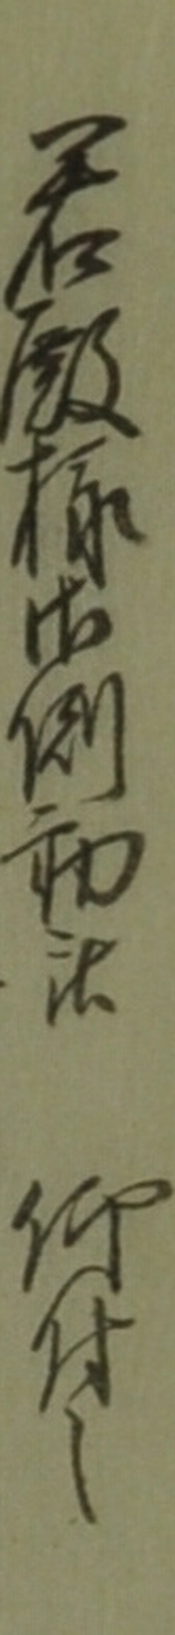若殿様御側被仰付之
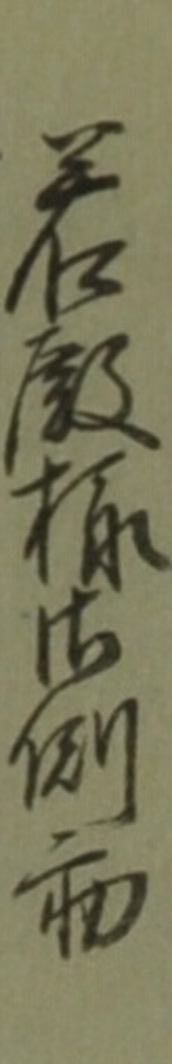若殿様御側勤
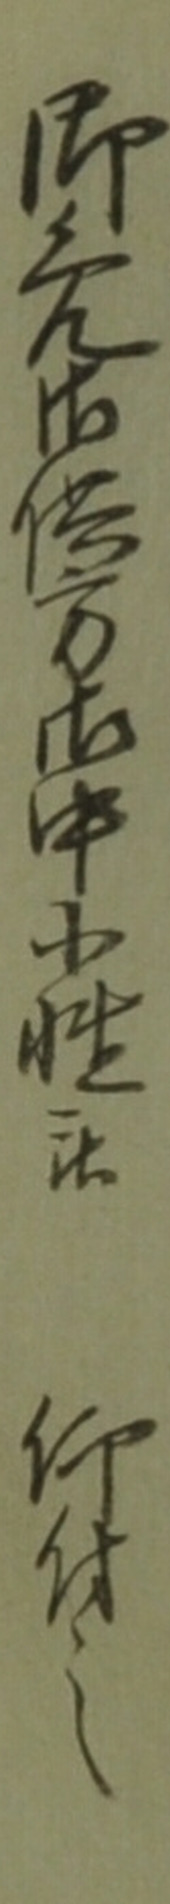御免御供方御中小性被仰付之

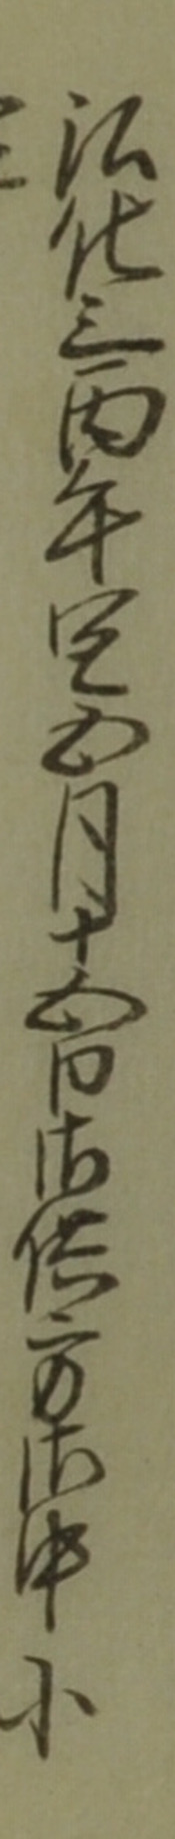一弘化三丙午閏五月十五日御供方御中小
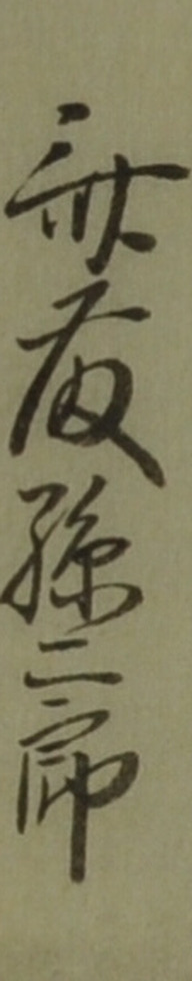斎藤孫次郎
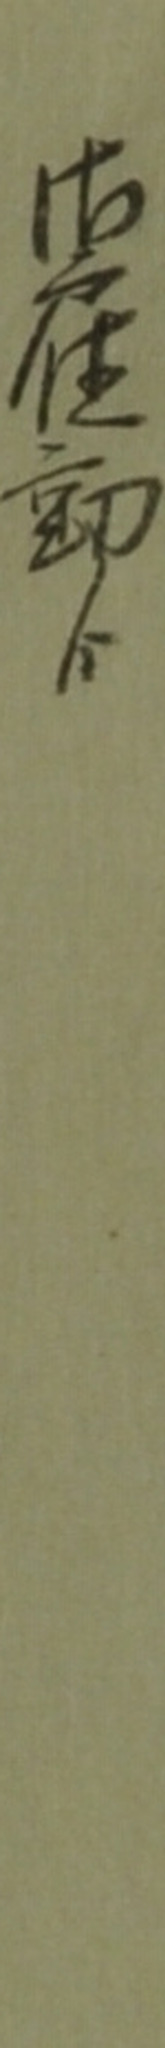御雇勤ゟ
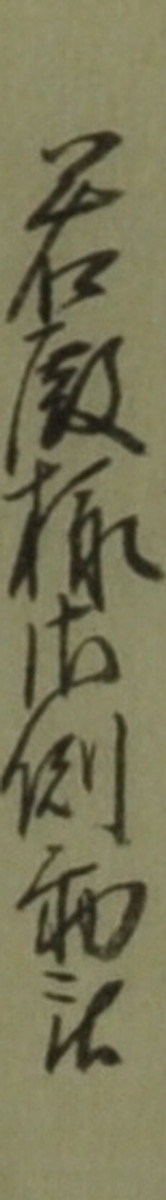若殿様御側勤被仰付之
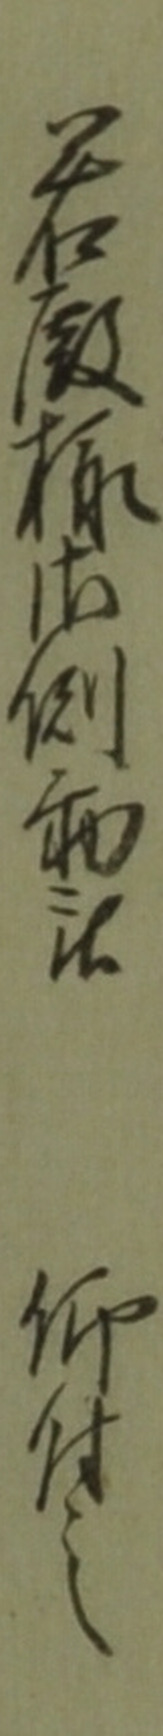若殿様御側勤被仰付之
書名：諸御役代々録（五）
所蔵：伊那市立高遠町図書館・合同会社AMANE
